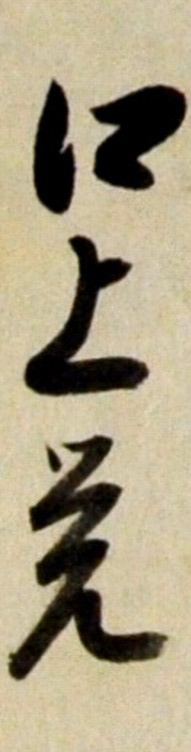口上覚
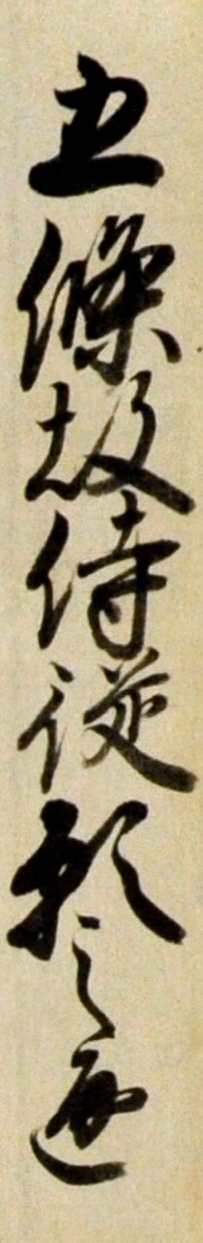五條故侍従願之通
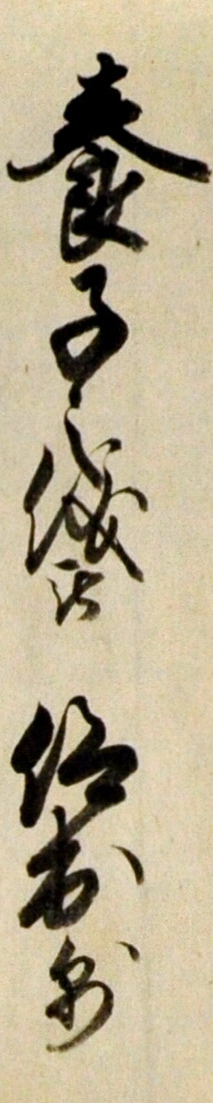養子之儀被仰出則
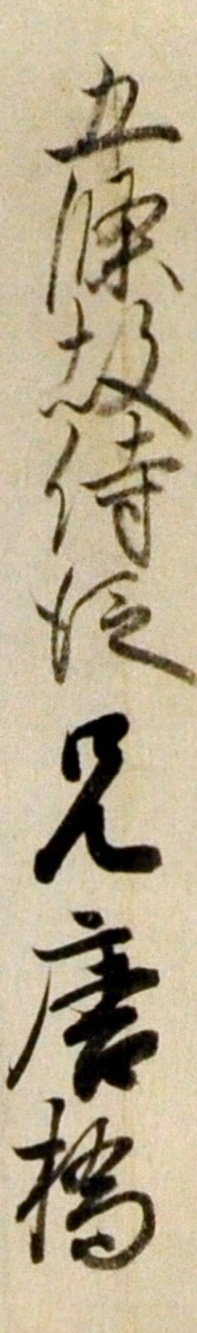五條故侍従兄唐橋
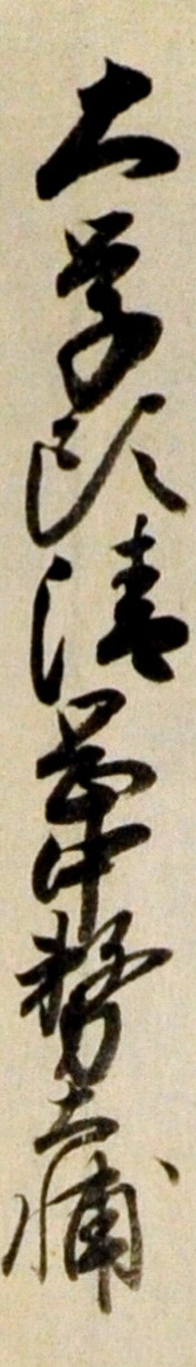大学頭清岡中務大輔
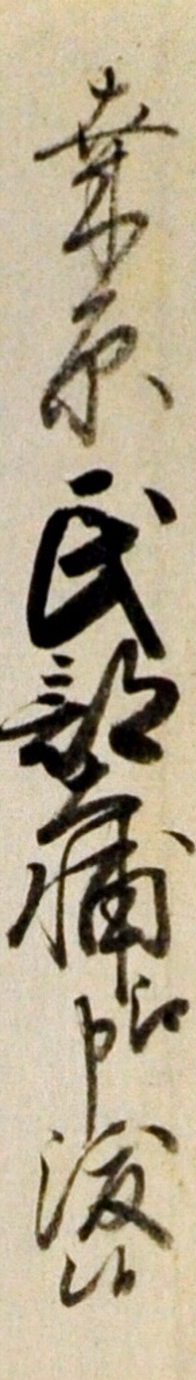桑原民部大輔江申渡候
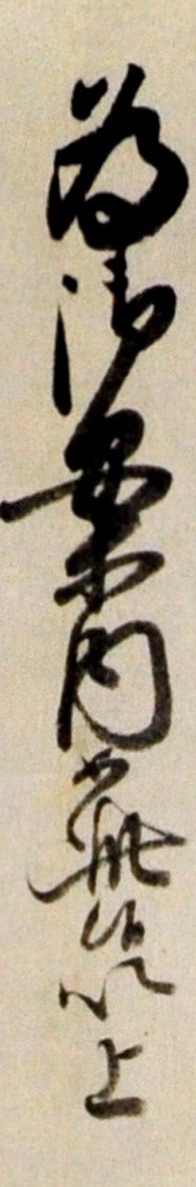為御案内如此候以上
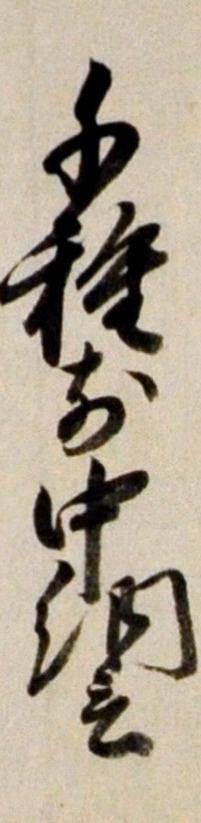千種前中納言
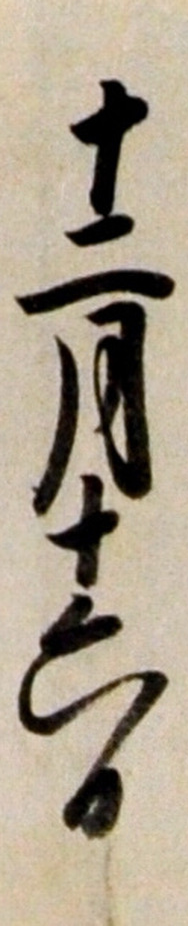十二月十六日
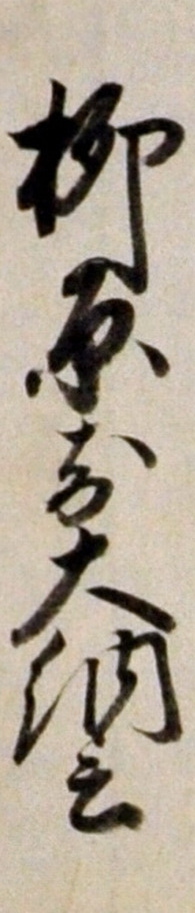柳原前大納言
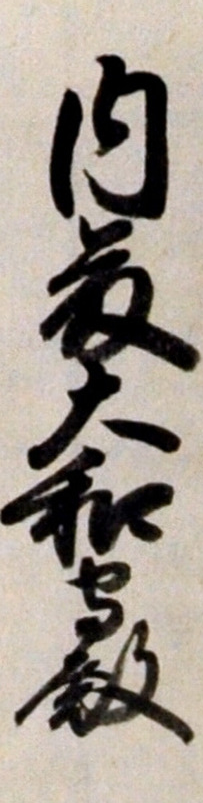内藤大和守殿
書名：口上覚
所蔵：伊那市立高遠町図書館・合同会社AMANE
